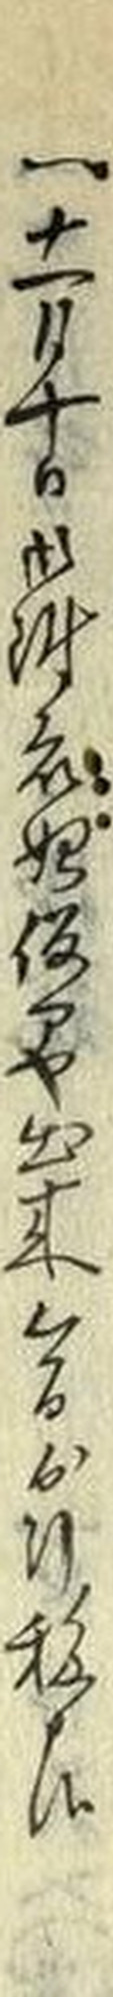一十一月十日御附衆始仮部屋出来今日ゟ引移候
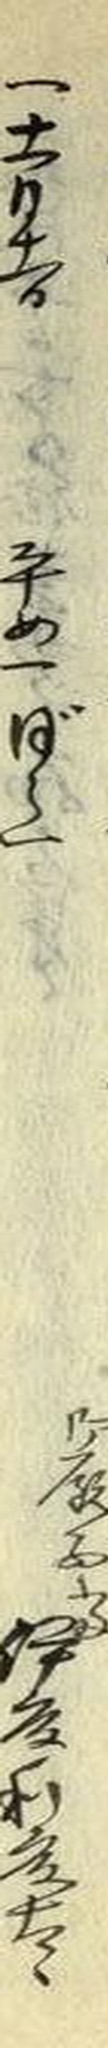一十一月十一日平め一ぼら一御厩別当伊藤利藤太へ
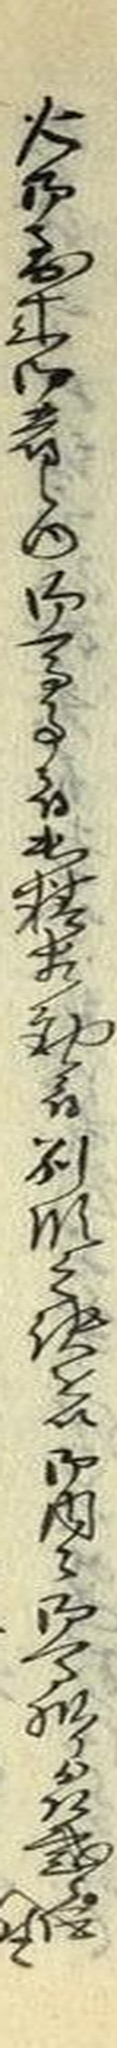右御到来御肴之内御馬事ニ付出精相勤候ニ付別段之訳を以御内々御馬掛りゟ頂戴被仰付候
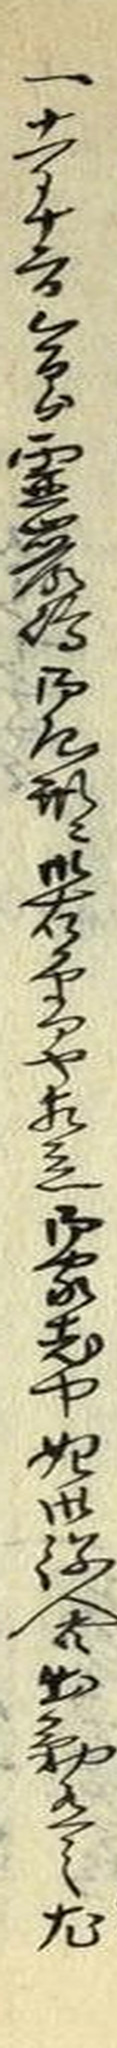一十一月十二日今日ゟ霊厳嶋御屋形ニ御右筆部屋相立御家老中始御役人共出勤有之尤
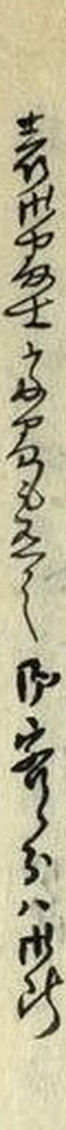表御番士当番も有之御客之分ハ御断
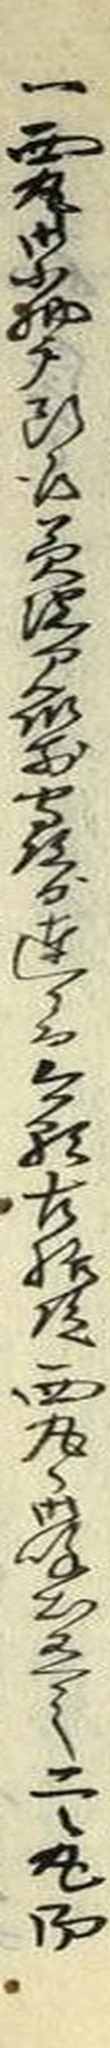一西丸御小納戸頭取美濃部筑前守殿ゟ達ニ而今朝左膳殿西丸へ御呼出有之二ノ丸御
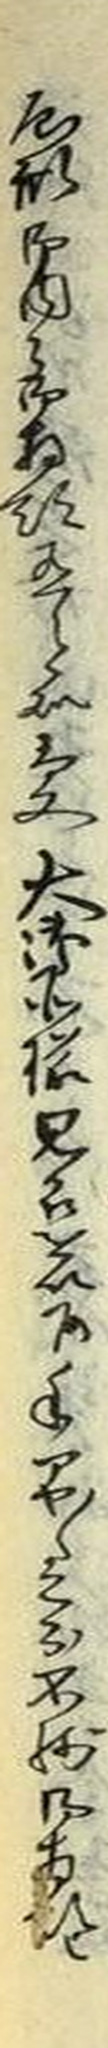屋形御内々御拝領有之候処尚又大御所様思召を以下手部屋〱之分不残御拝領被
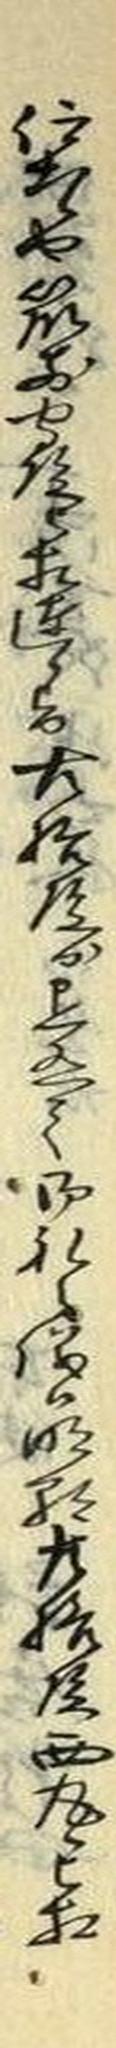仰出候由筑前守殿被相達候旨左膳殿ゟ申上有之御礼之儀ハ明朝左膳殿西丸へ被相
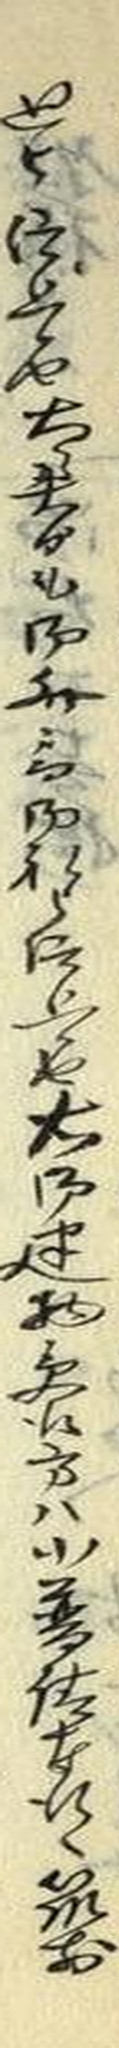廻被仰上候由大奥ゟも御文ニ而御礼被仰上候由右御建物受取方ハ小普請奉行へ筑前
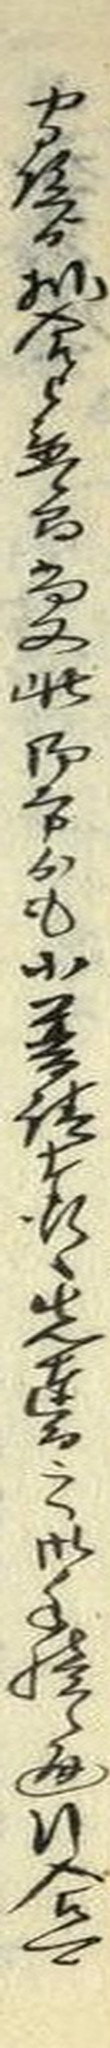守殿ゟ掛合被置候間尚又此御方ゟも小普請奉行へ先達而之御手続之通引合可
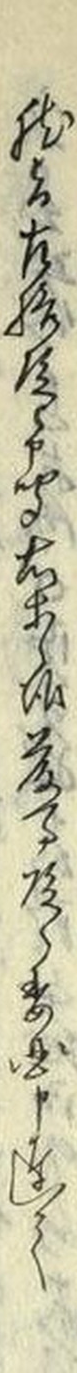然旨左膳殿被申聞右等之趣藤馬殿へ委曲申達之
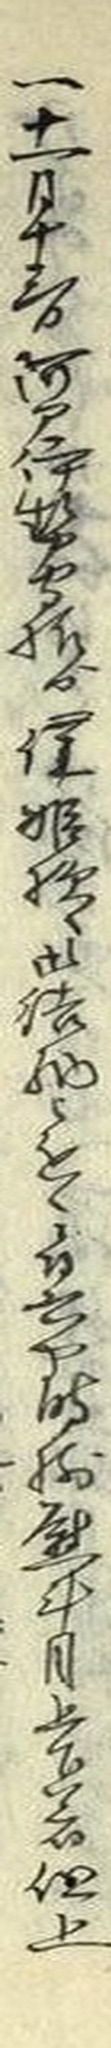一十一月十三日阿部伊勢守様ゟ謹姫様へ御結納被進候ニ付六半時揃熨斗目上下着但上
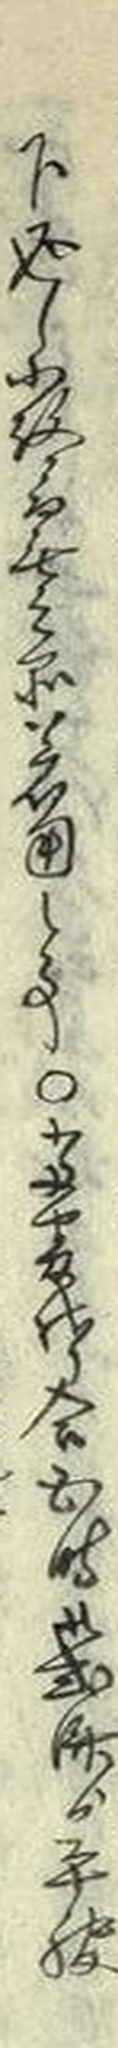下通し小紋ニ而無之品着用之事〇当番代り合五時御式済ゟ平服
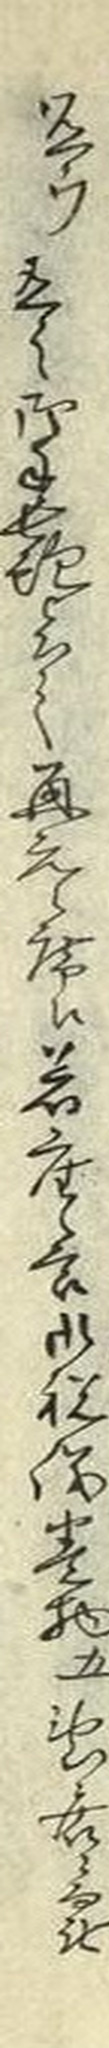有之御手長鮑被下之再元之席江着座之節御祝儀巻物五敷居ニ而被
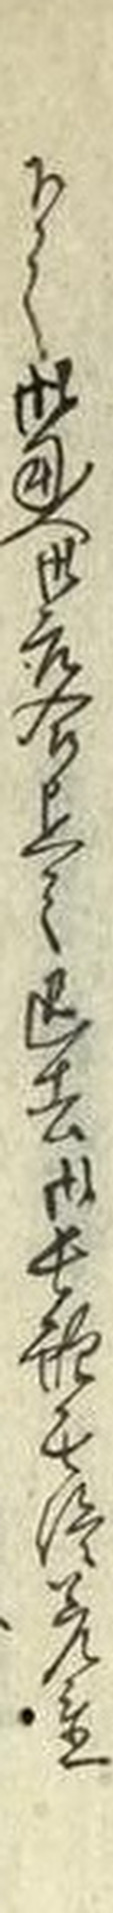下之御用人御取合申上之退去御長鮑其儘差置
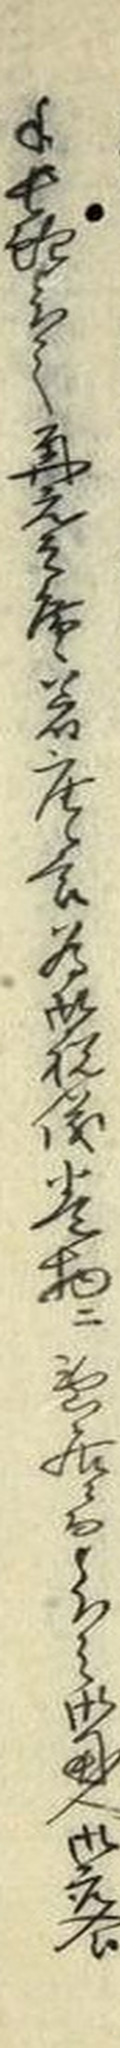手長鮑被下之再元之席江着座之節御祝儀巻物二敷居ニ而被下之御用人御取合
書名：少傅日録抄（斉善付側向頭取日記、在府）
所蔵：福井県文書館 Fukui Prefectural Archives
